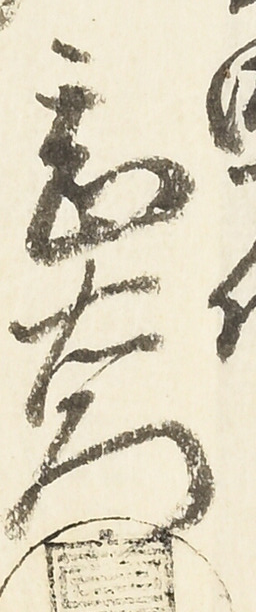甚右衛門
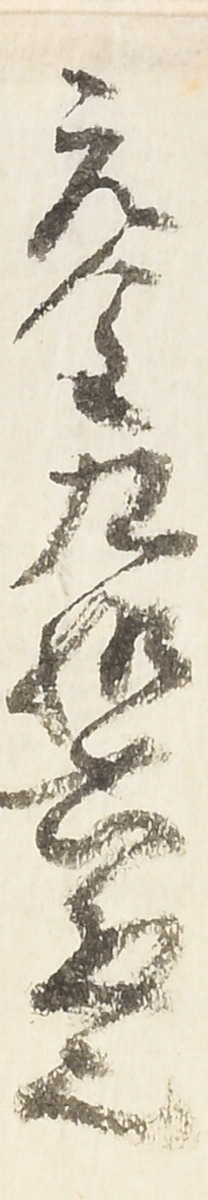元金九拾六両也
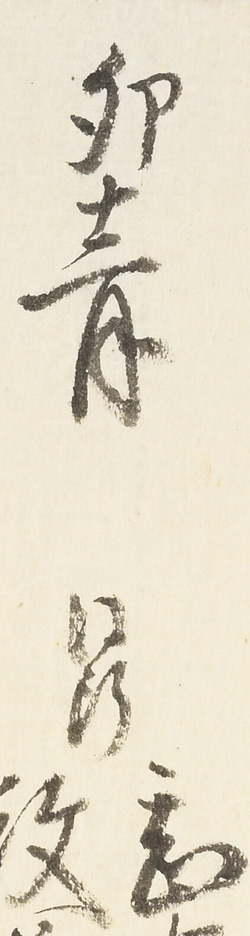卯十二月同断
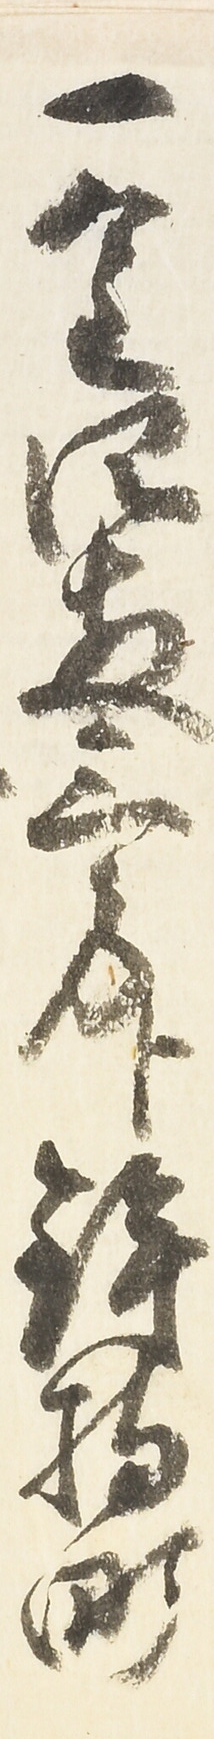一金四両三分ト鉾持町
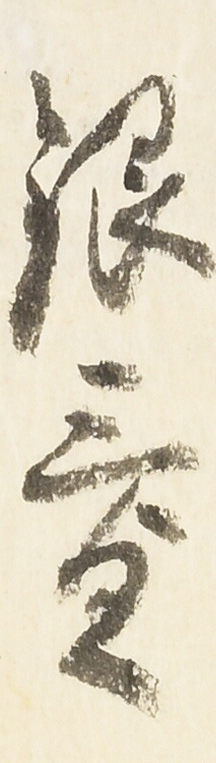銀三匁
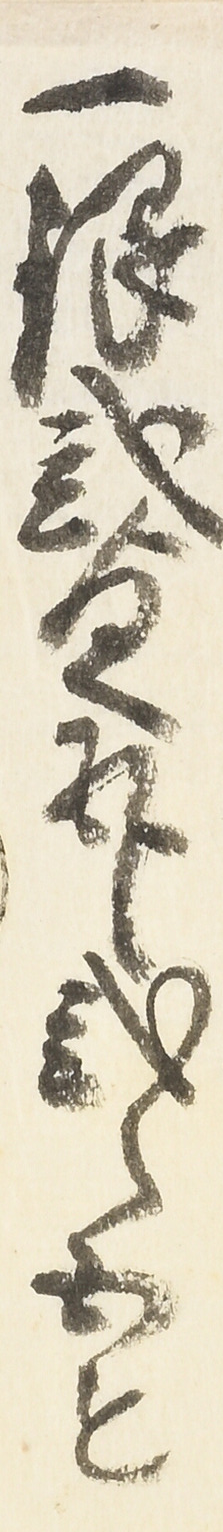一銀弐匁五分弐厘五毛
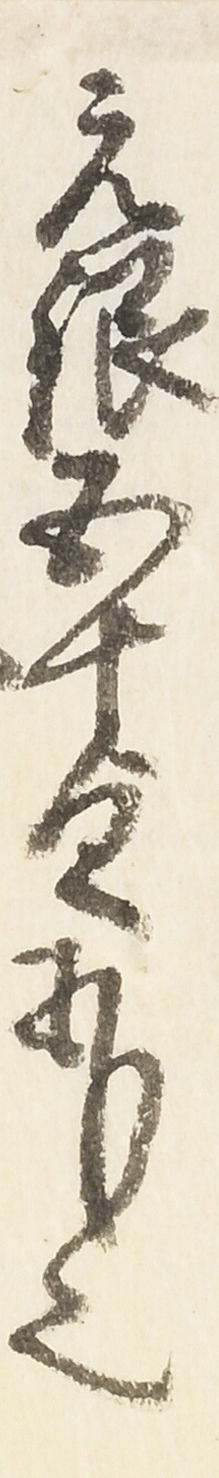元銀五十匁五分也
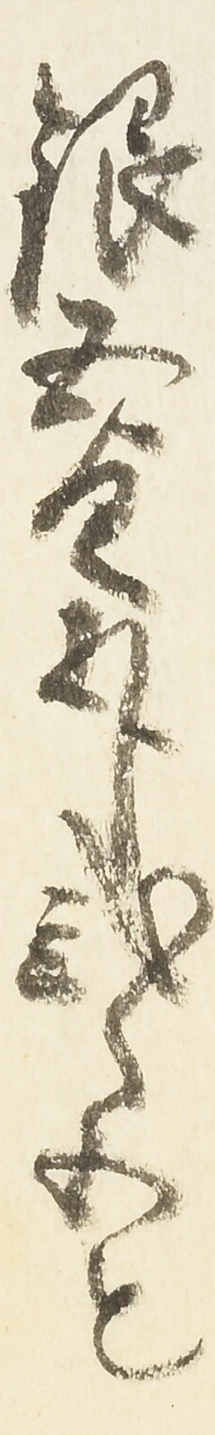銀五匁五分弐厘五毛
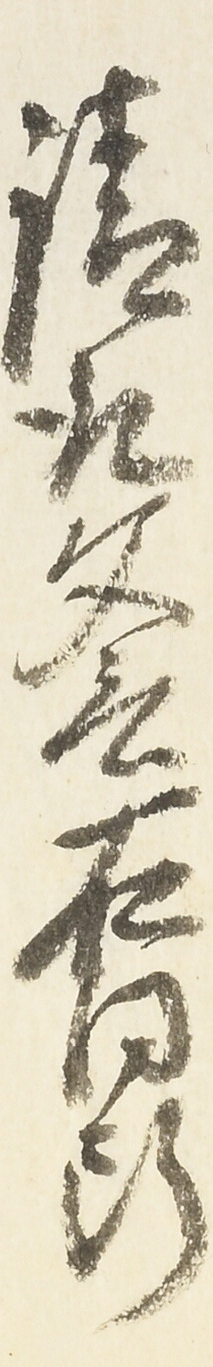請取文言右同断
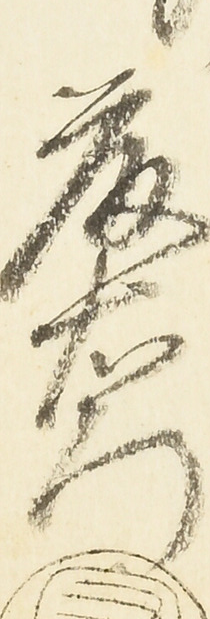藤右衛門
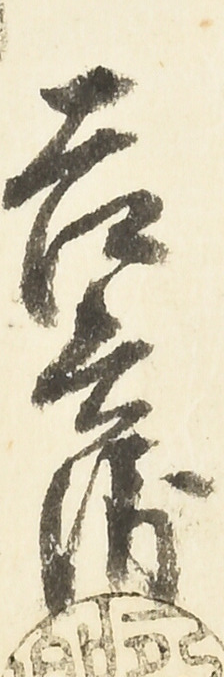吉兵衛

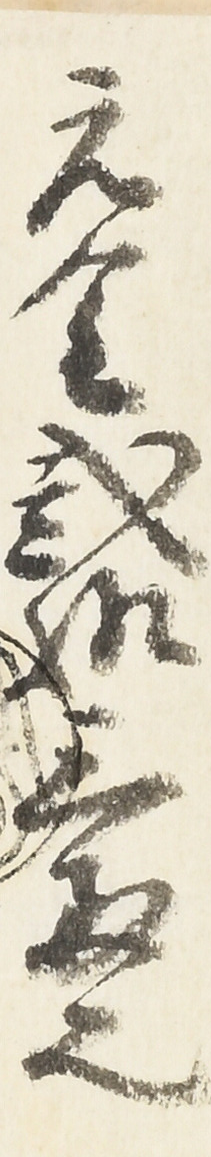元金弐拾三両也
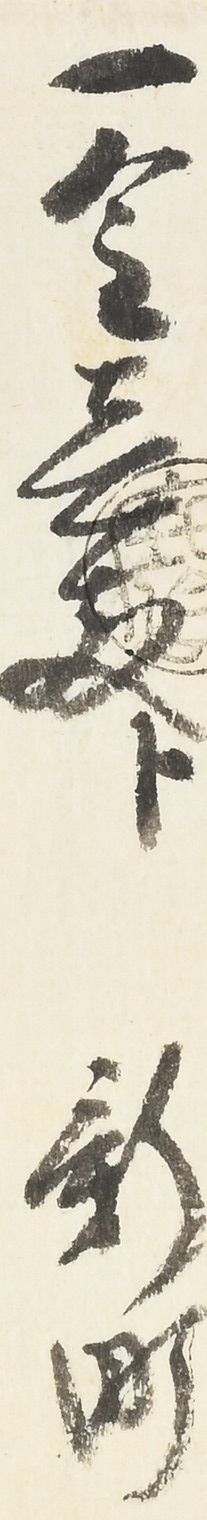一金壱両ト新町
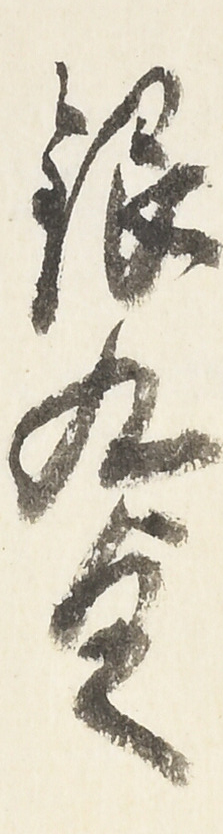銀九匁
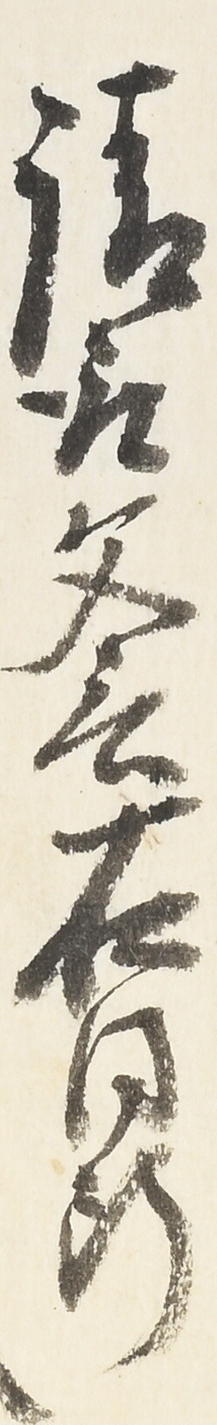請取文言右同断
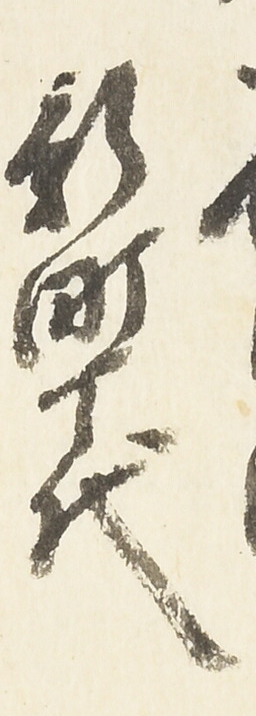新町丁代
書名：御才覚金御利足割渡扣帳
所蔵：伊那市立高遠町図書館・合同会社AMANE
